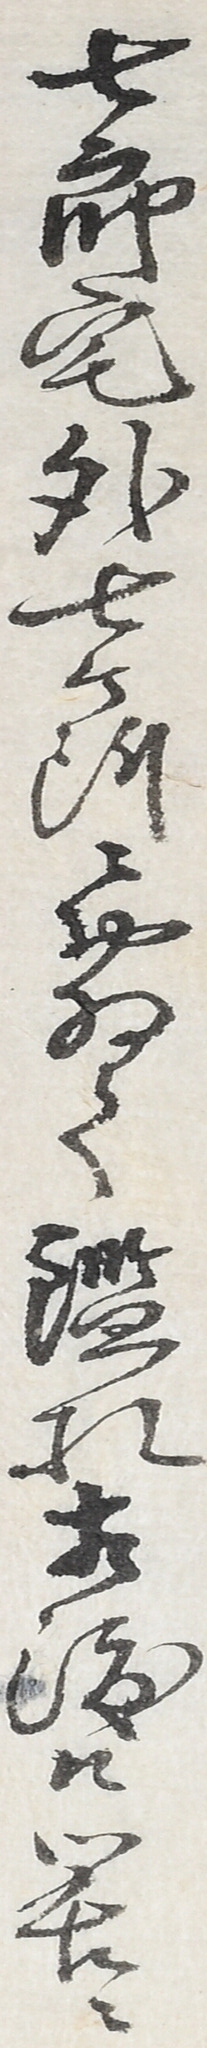七郎宅外七ケ所ニおゐて鑑札相渡候筈ニ
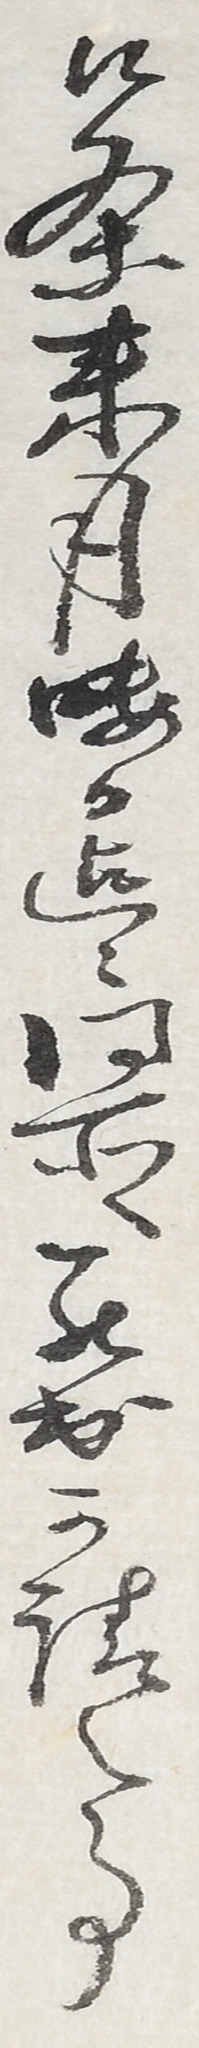候条来月晦日迄ニ同所へ罷出可請之事
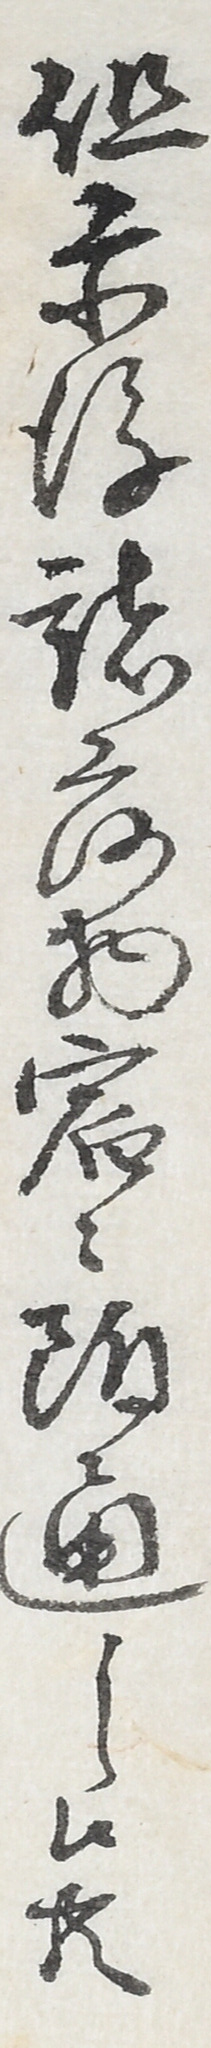但爾後諸荷物宿ニ附通し候共
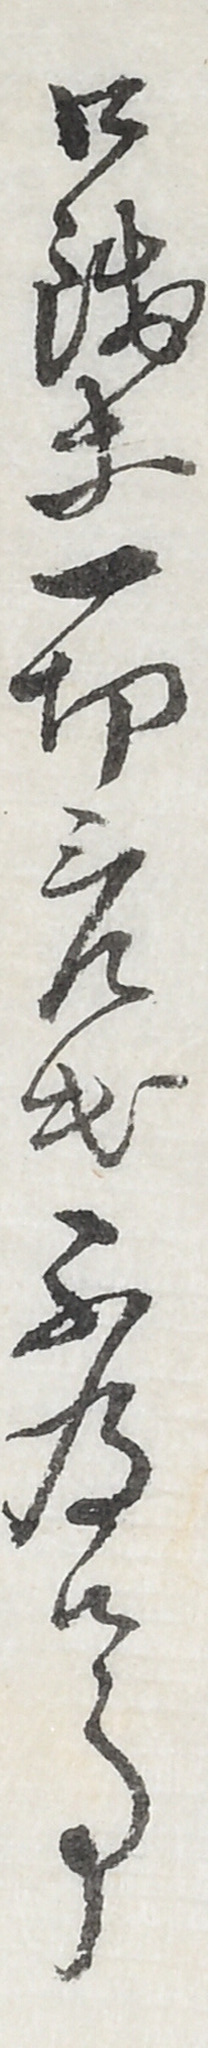口銭等一切差出不及候事
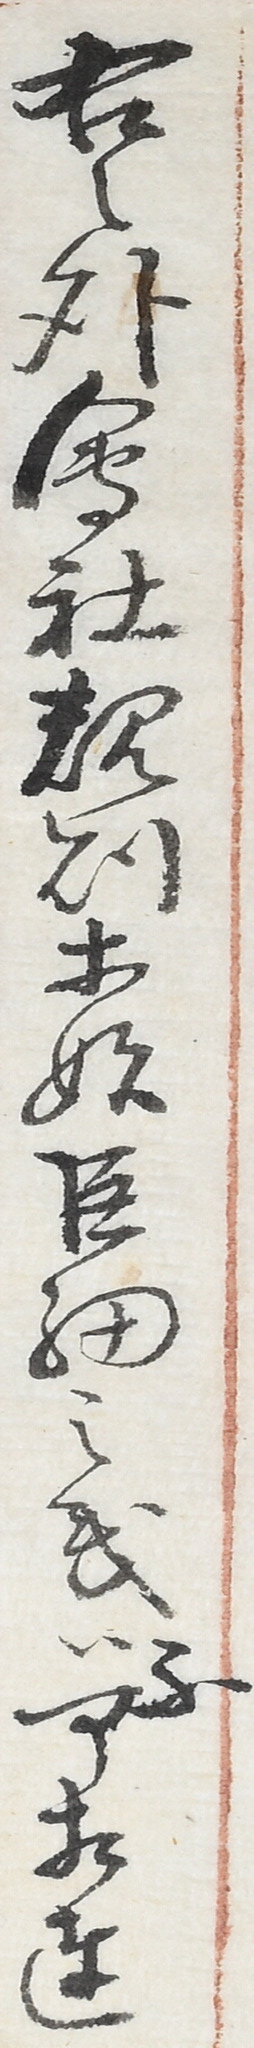右之外会社規則等始巨細之義ハ不可相達
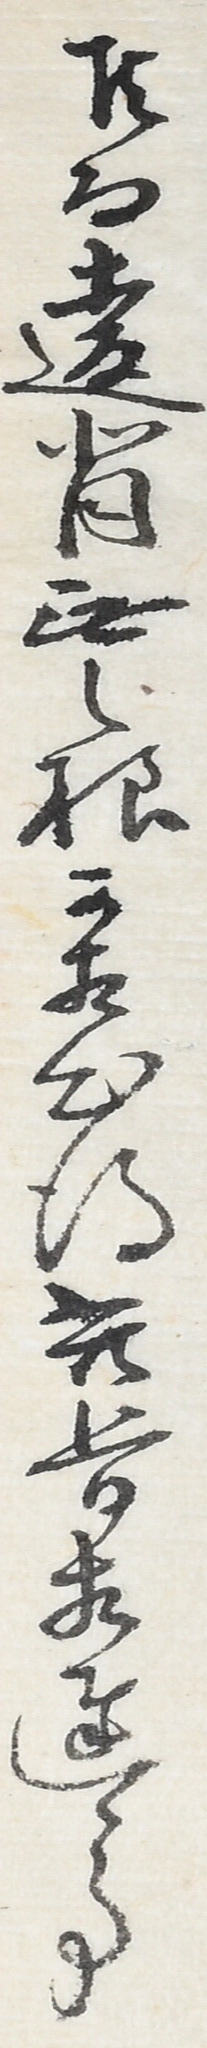候而違背無之様可相心得此旨相達候事

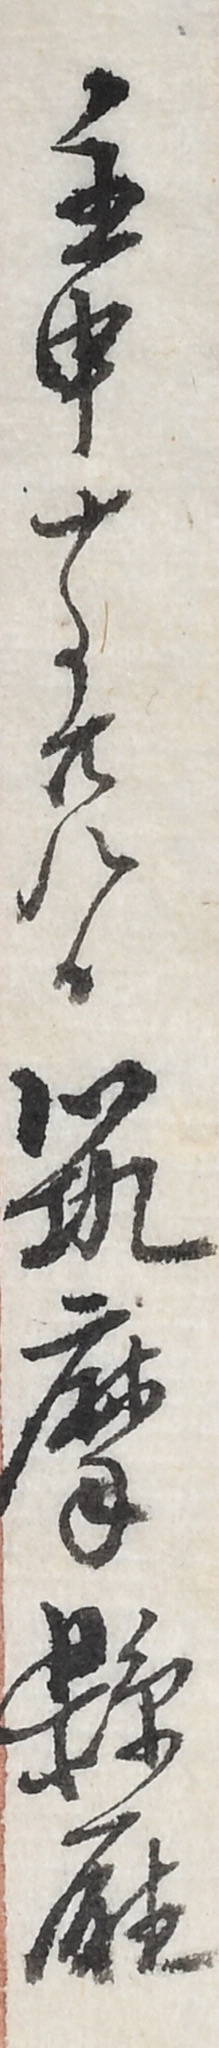壬申十月廿八日筑摩県庁
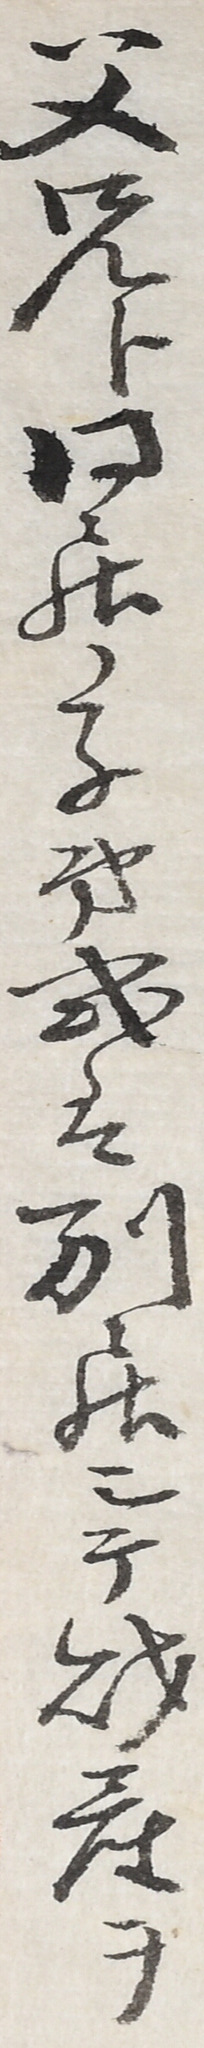父兄ト同居ノ子弟或は別居シテ財産ヲ
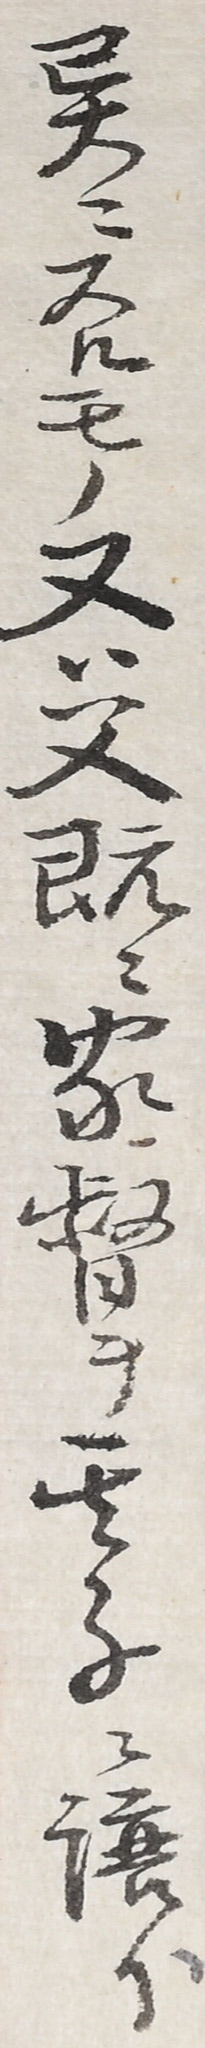異ニスルモノ又ハ父既ニ家督ヲ其子ニ譲リ
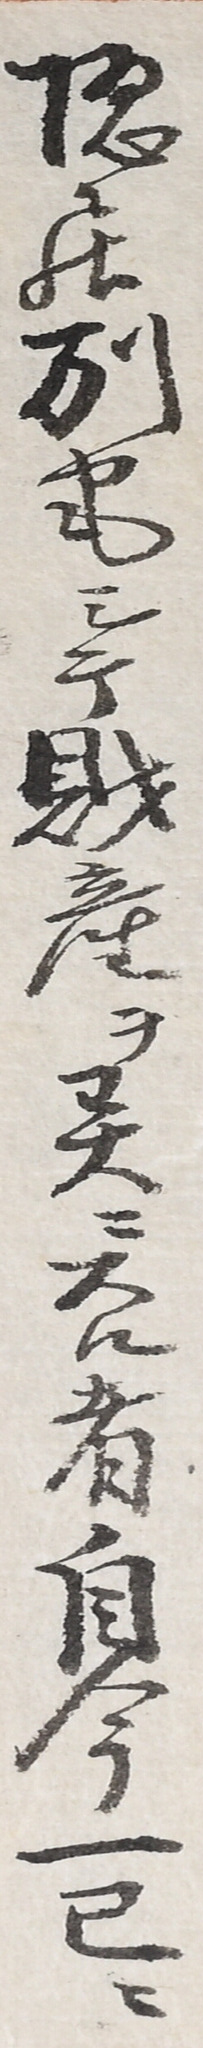隠居別宅シテ財産ヲ異ニスル者自今一己ニ
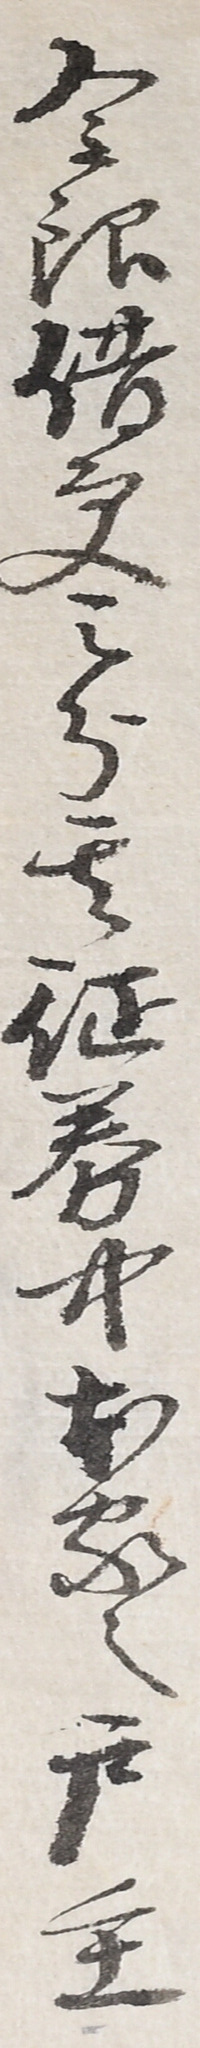金銀借受之分其証券中本家之戸主
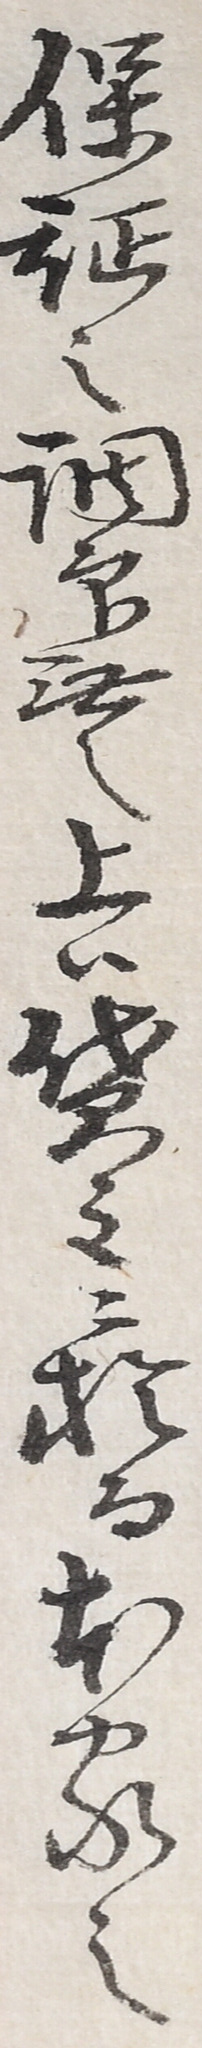保証之調印無之上ハ貸主ニ於而本家之
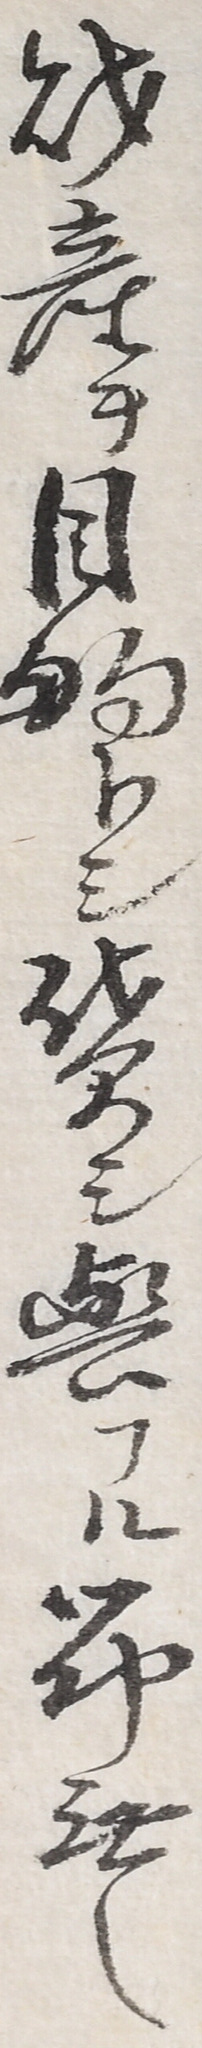財産ヲ目的トシ貸シ与フル筋無之
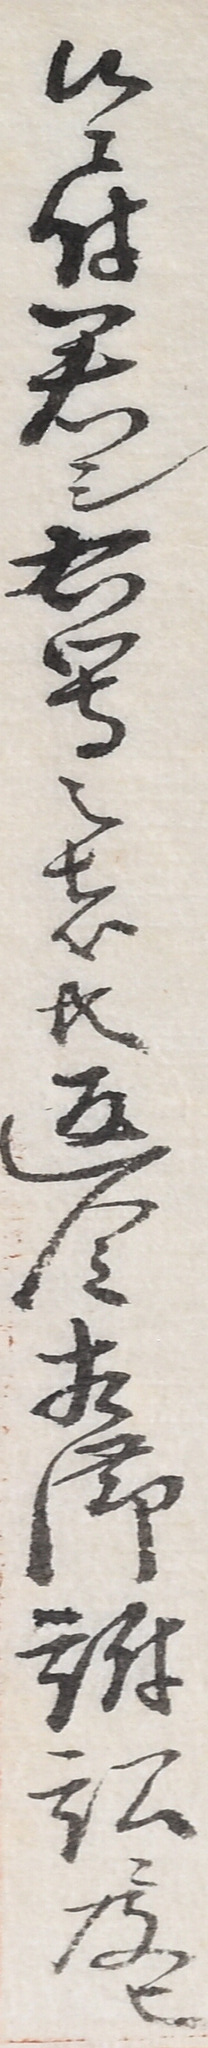候ニ付若シ右等之者共返金相滞訴訟ニ及ヒ
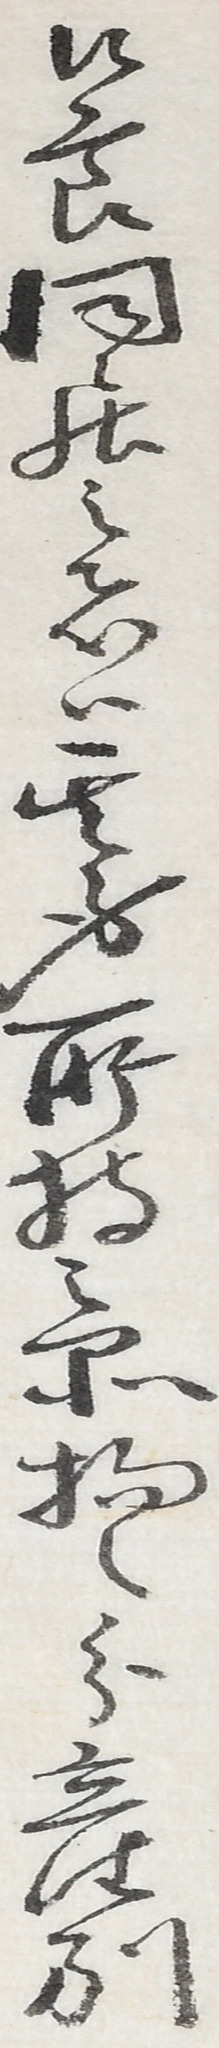候節同居之者ハ其身所持之品拘之分産別
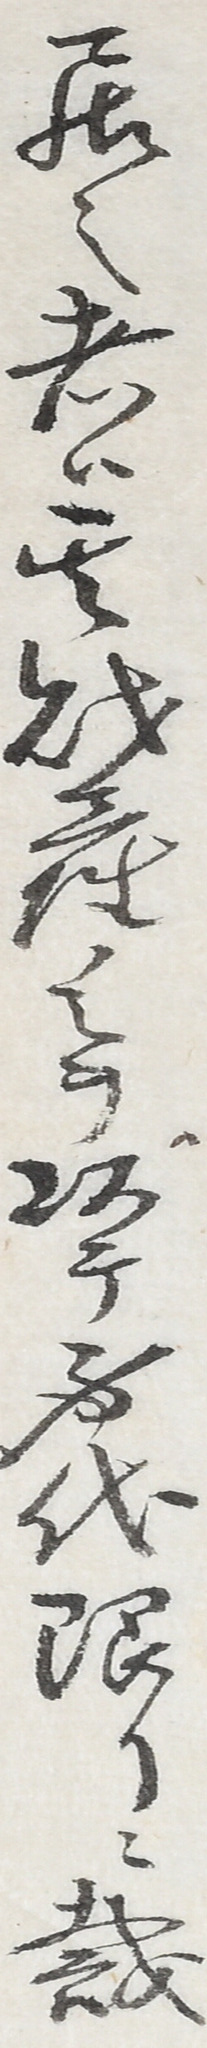居之者ハ其財産ノミヲ以テ身代限りニ裁
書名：壹番・御布告一式
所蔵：伊那市立高遠町図書館・合同会社AMANE
